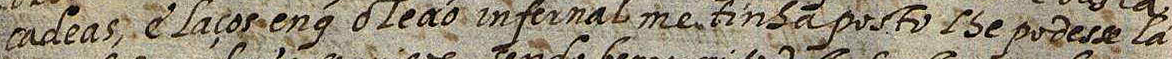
cadeas, e laços en q̄ o leaõ infernal me tinha posto lhe podesse lá
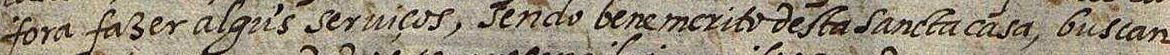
fora fazer algūs seruiços, sendo benemerito desta sancta casa, buscan
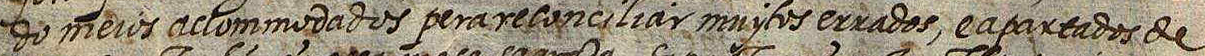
do meios accomodados pera reconciliar muytos errados, e apartados de
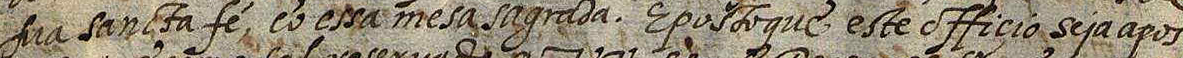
sua sancta fé, cō essa mesa sagrada. E posto que este offiçio seja apos
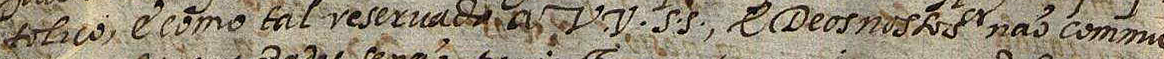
tolico, e como tal reseruado a V.V. S.S. & Deos nosso sor naõ commu
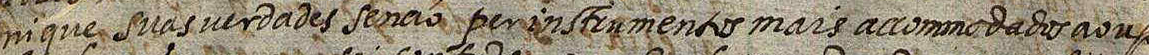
nique suas uerdades senaõ per instrumentos mais accommodados ao uso
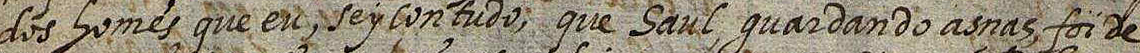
dos homēs que eu, sey contudo, que Saul, guardando asnas, foi de
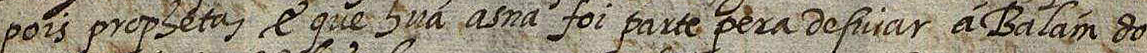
pois popheta, e que huā asna foi parte pera desuiar á Balam do
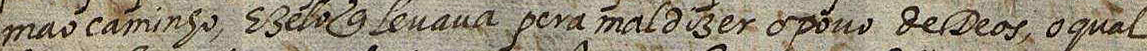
mao caminho, E zelo q̄ leuaua pera maldizer o pouo de Deos, o qual
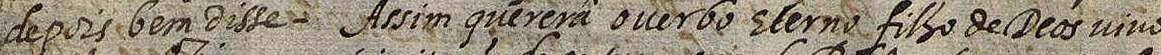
depois bem disse - Assim quererâ o uerbo Eterno filho de Deos uiuo
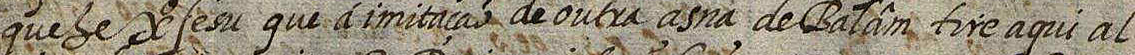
que he Xo Jesu q á imitaçaõ de outra asna de Balâm tire aqui al
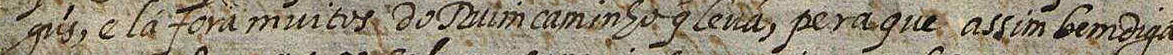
gūs, e lá fora muitos do Ruim caminho q̄ leuā, pera que assim bem digā
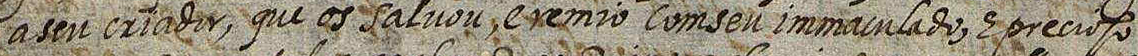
a seu criador, que os saluou, e remio com seu immaculado, E precioso
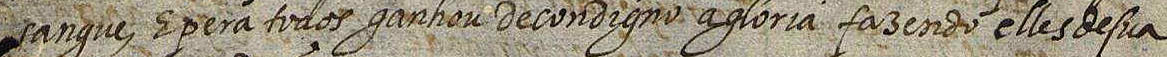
sangue, E pera todos ganhou de condigno a gloria fazendo elles de sua
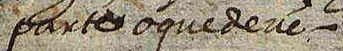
parte o que deuē -
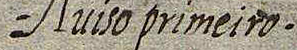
- Auiso primeiro.
